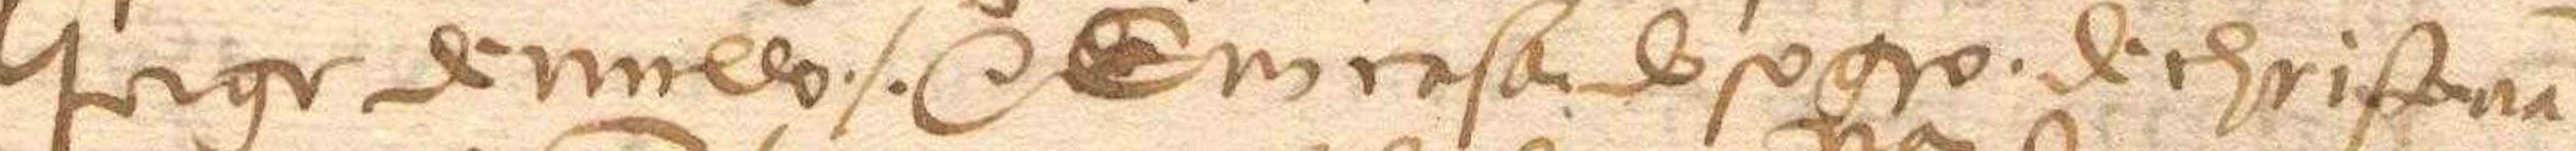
Jorge de mello./. e Em casa do sogro. de christouā
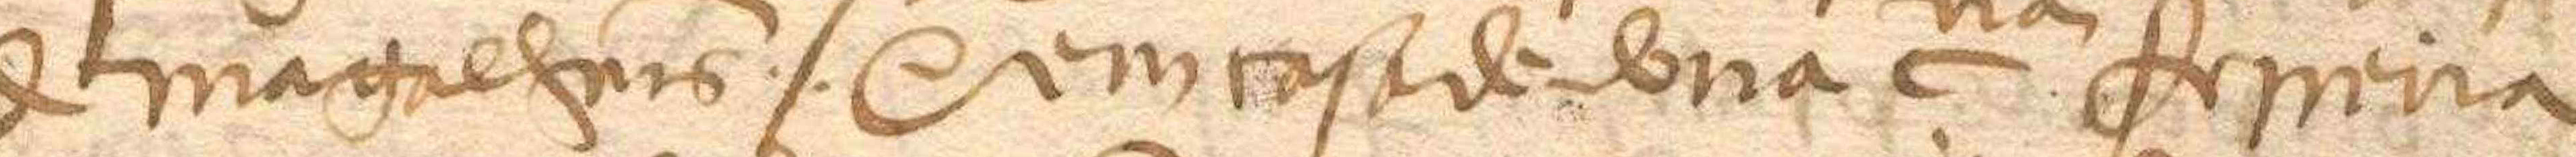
de magalhães./. e em casa de dona Cna ferreira
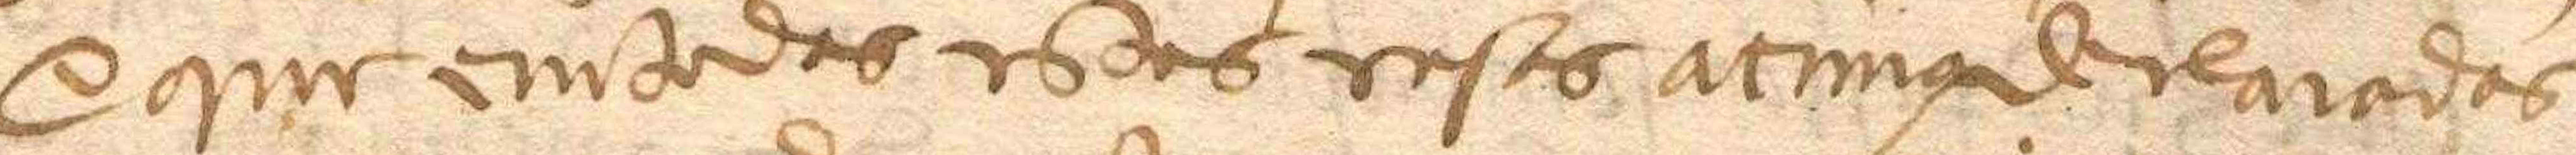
e que em todas estas casas açima declaradas
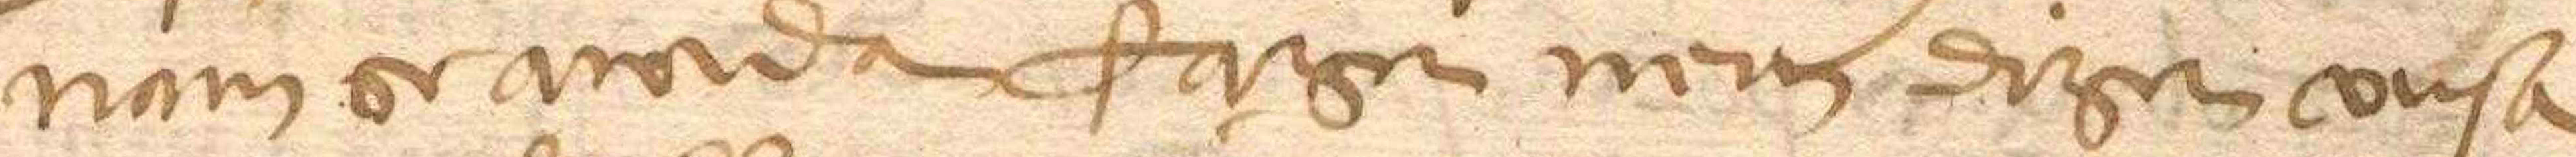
nam se acorda fazer nem dizer cousa
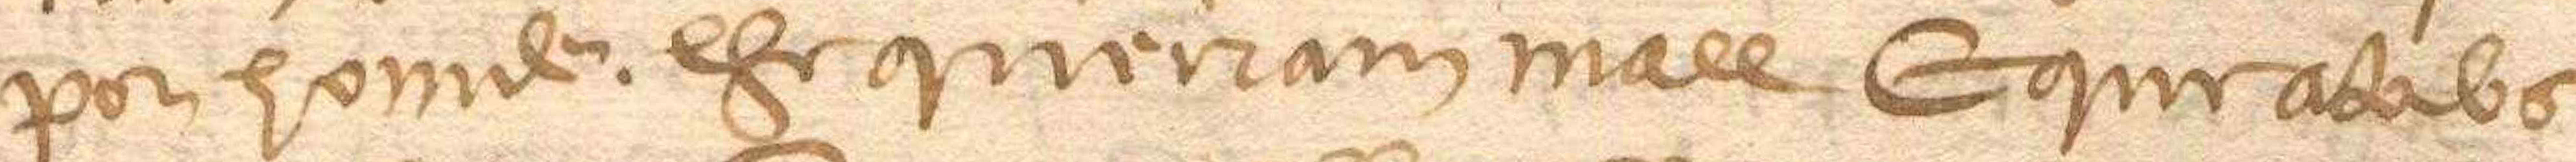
por homde. lhe queiram mall E que a todos
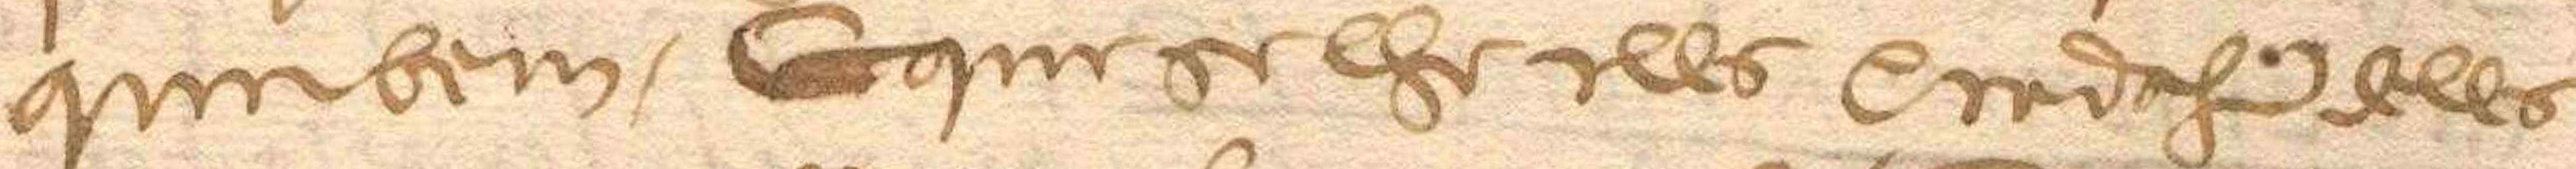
quer bem / E que se lhe elles e cada hū delles
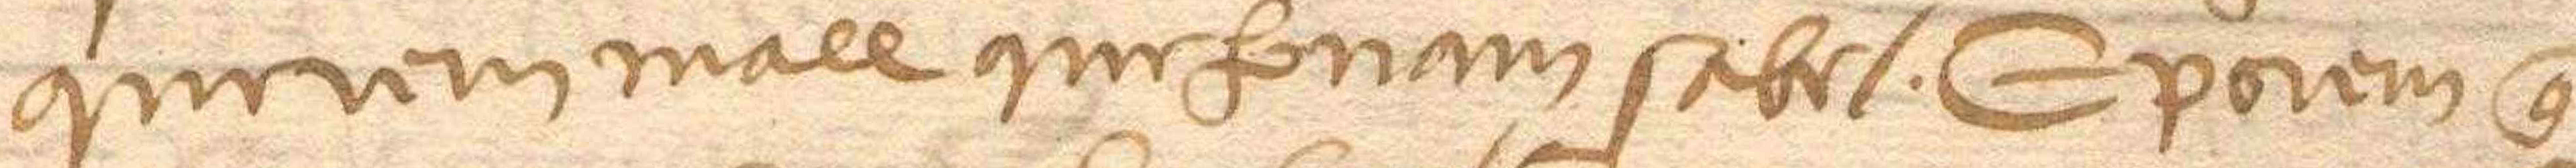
querem mall que ho nam sabe/. E porem q̄
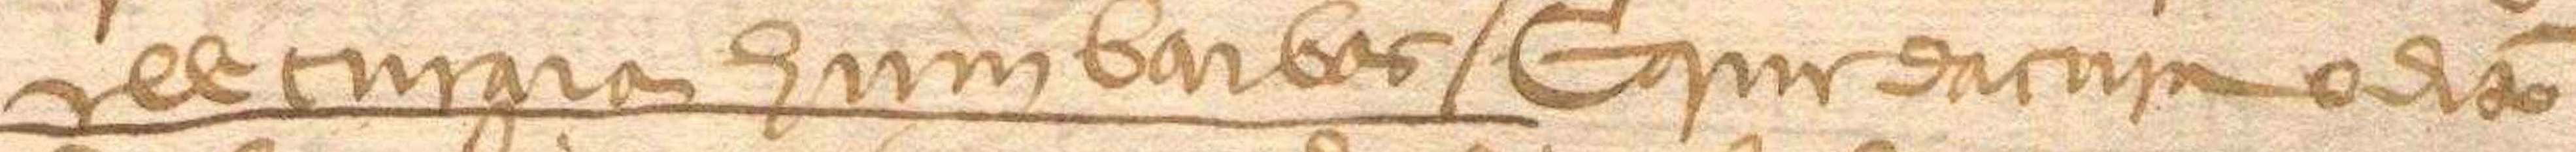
elle curara hum barbas / E que da cura o dito
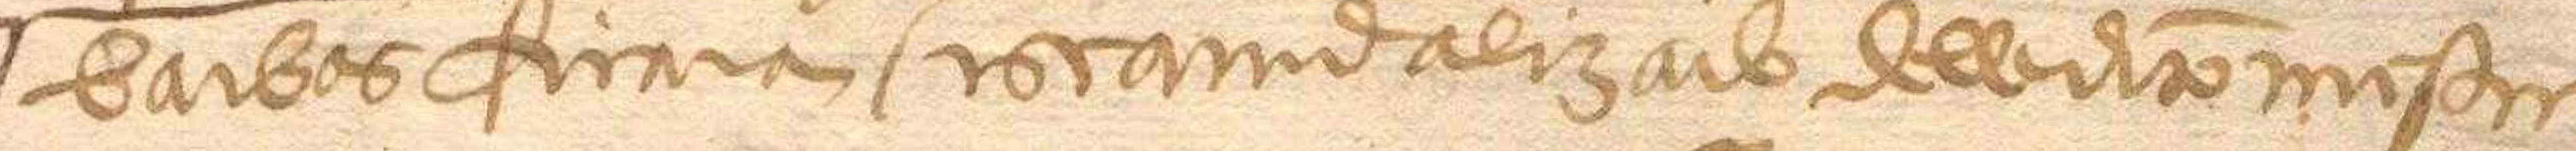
barbas ficara / escamdalizado delle dito mestre
